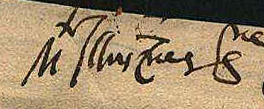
Mto Jllustres Sres
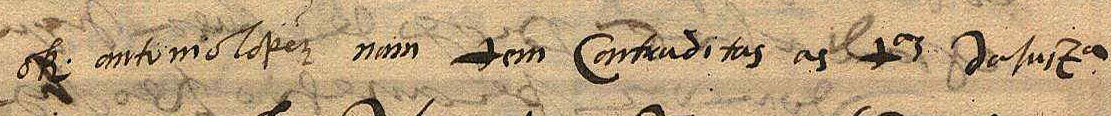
o R. antonio lopez nam tem Contraditas as tas da Justa
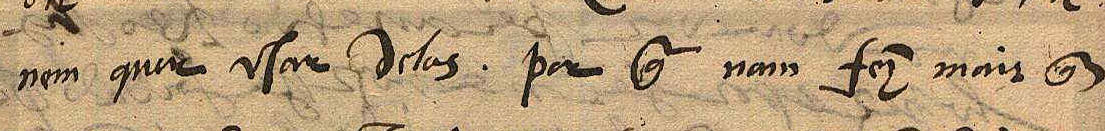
nem quer vsar delas . porq̄ nam fez mais q̄
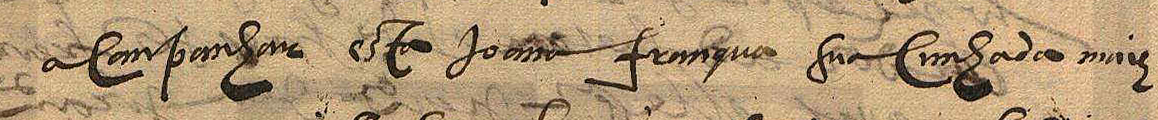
aCompanhar esta Joana franqua sua Cunhada mais
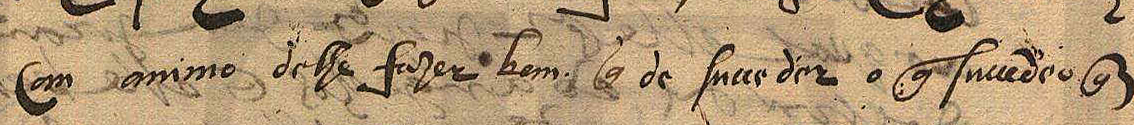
Com animo de lhe fazer bem q̄ de succeder o q̄ succedeo q̄
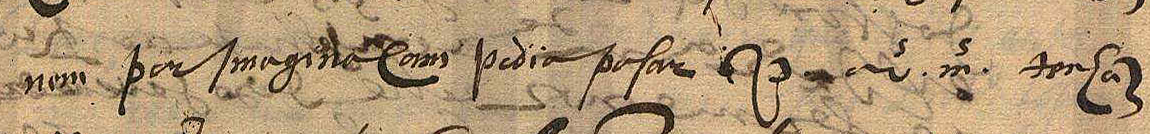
nem por JmaginaÇam podia pasar P a vs. ms. tenhā
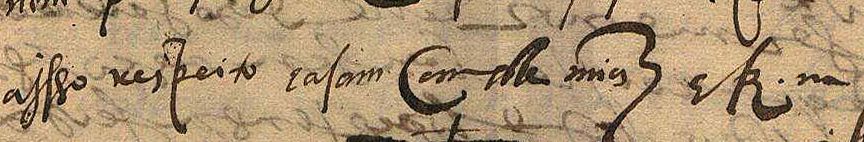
a Jsso respeito E aJam Com elle mīa E R. m
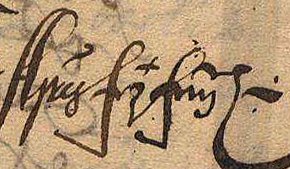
Ayres frz̄ fernes
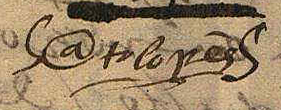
āto lopes
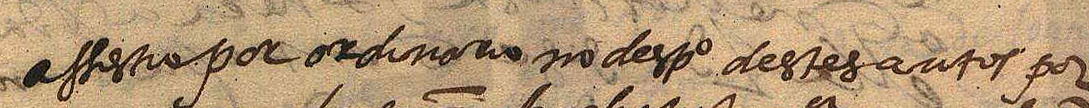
assistio por ordinario no despo destes autos por
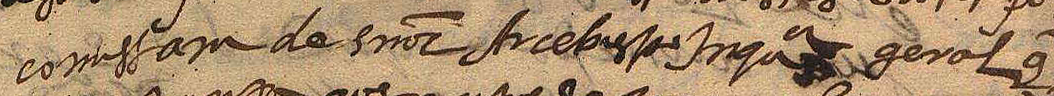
comissam do snōr Arcebispo Jnqu.or geral q̄
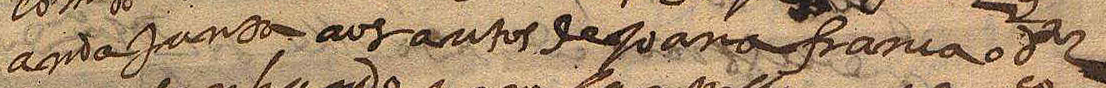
anda Junta aos autos de Joana franca o dtor
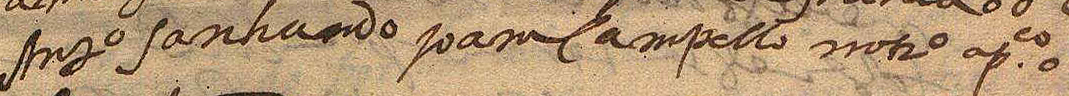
Anto Sanhundo Joam Campello notro ap.co o
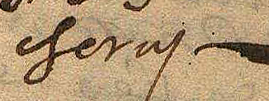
escruj
